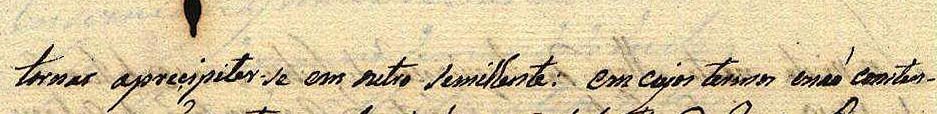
tornar a precipitar-se em outro semilhente. em cujos termos e naõ conten
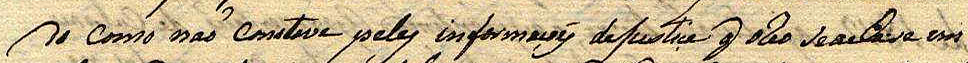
do como naõ constava pelas informaçoẽs da Justiça q̄ o Reo se achase em
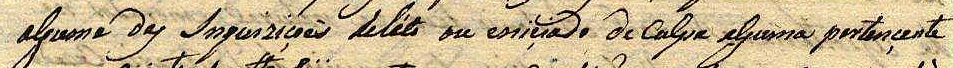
alguma das Inquiziçoẽs delito ou eniciado de culpa alguma pertencente
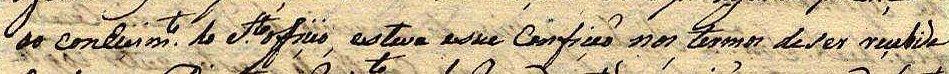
ao conhecim.to do S.to officio, estava a sua confição nos termos de ser recebida
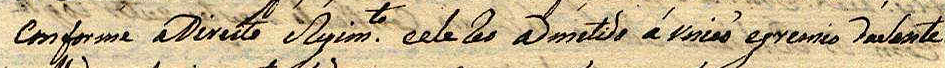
conforme a Direito e Regim.to e ele Reo admetido á vniaõ e gremio da Santa
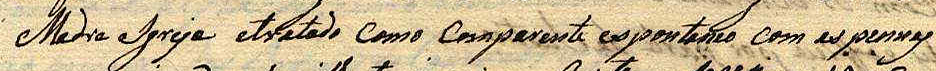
Madre Igreja e tratado como comparente espontaneo com as pennas
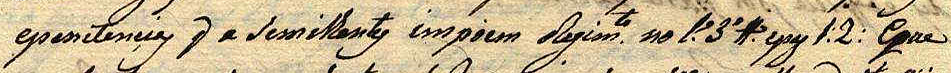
e penitencias q̄ a semilhantes impoem o Regim.to no l.o 3o tt.o e pag 1:2: E que
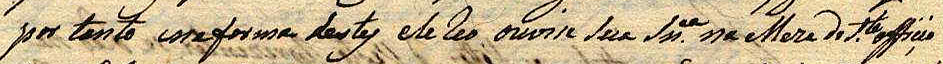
portanto e na forma destes ele Reo ouvise sua Sn.ca na Meza do S.to officio
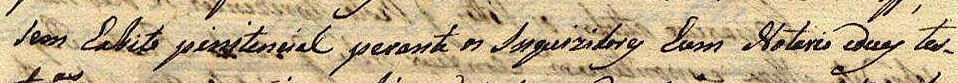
sem habito penitencial perante os Inquizidores hum Notario e duas tes
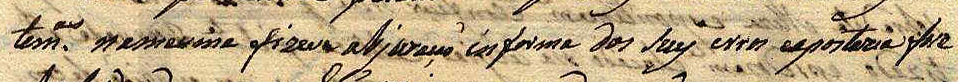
tem.as na mesma fizese abjuraçaõ informa dos seus erros e apostazia fose
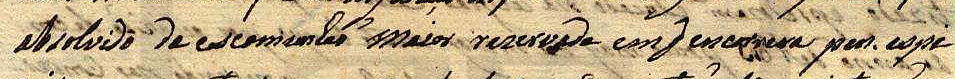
absolvido de escomunhaõ maior rezervada em q̄ encorrera pen. espe
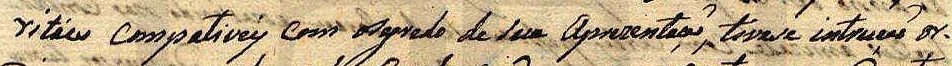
ritaes compativeis com o segredo de sua Aprezentaçaõ, tivese intruçaõ or
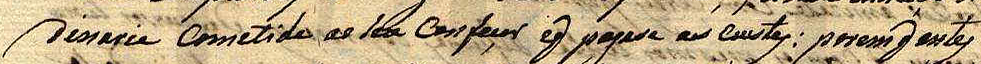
dinaria cometida ao seu confeçor e q̄ pagase as custas: porem q̄ antes
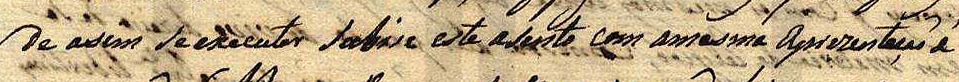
de asim se executar subise este asento com a mesma Aprezentaçaõ á
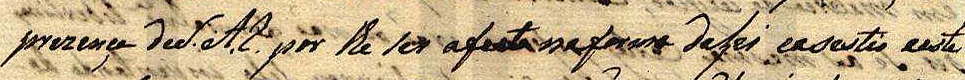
prezença de S. A. R. pôr lhe ser afesta na forma da Lei e asistio a este
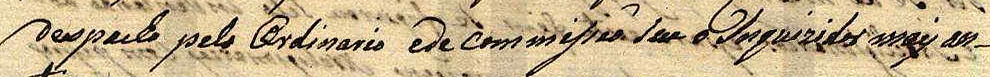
despacho pelo Ordinario e de commissaõ sua o Inquizidor mais an
